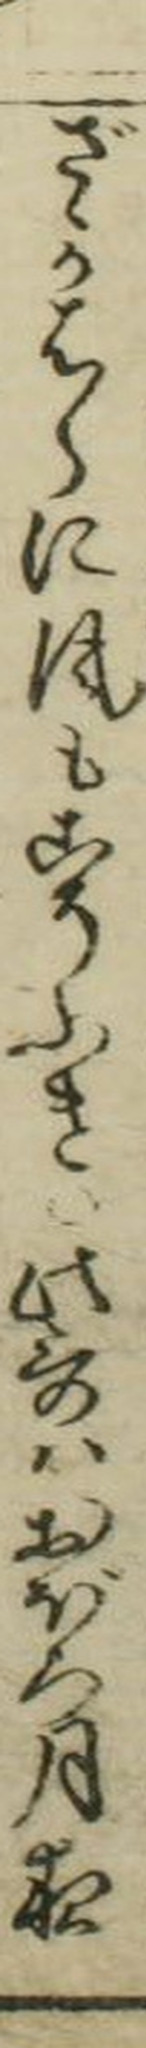ざゝかはらに風もこそふけ○此哥はおぼろ月夜
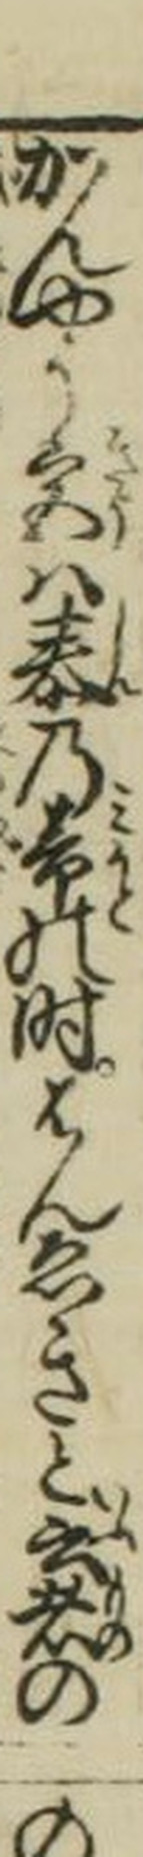かんやう宮は秦の帝の時。はんゑきと云者の
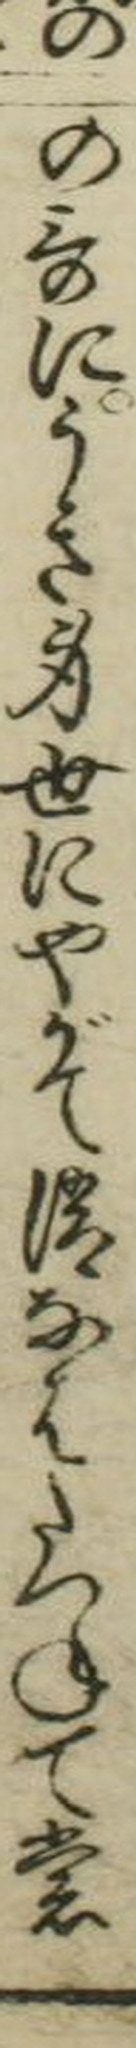の哥に。うき身世にやがて消なはたつねても
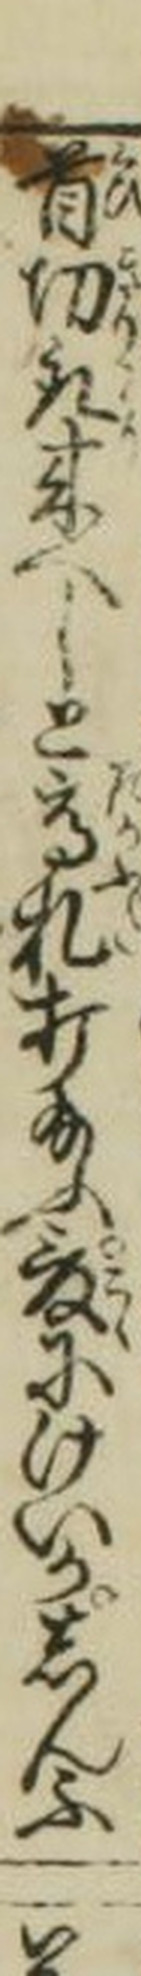首切取来へしと高札打給ふ。爰にけいか。しんふ
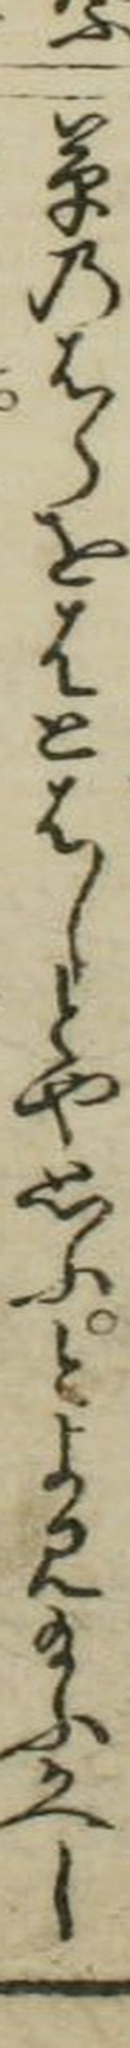草のはらをはとはしとや思ふ。とよみ給ふかへし
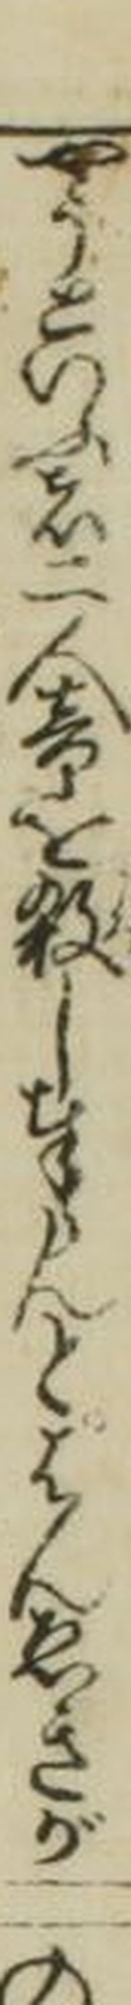やうといふ者二人帝を殺し奉らんと。はんゑきが
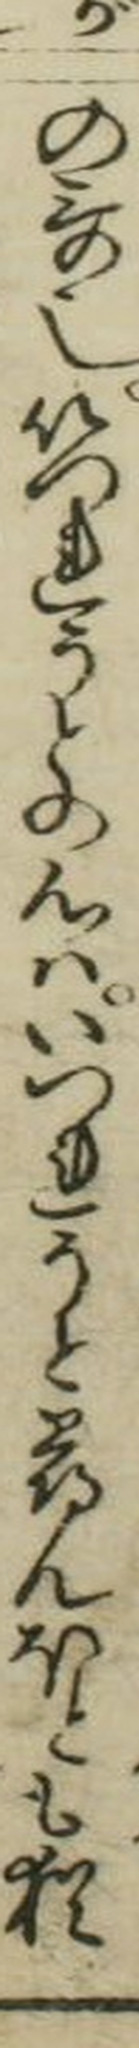の哥也。いつれそとの心は。いつれそと尋んほとも猶
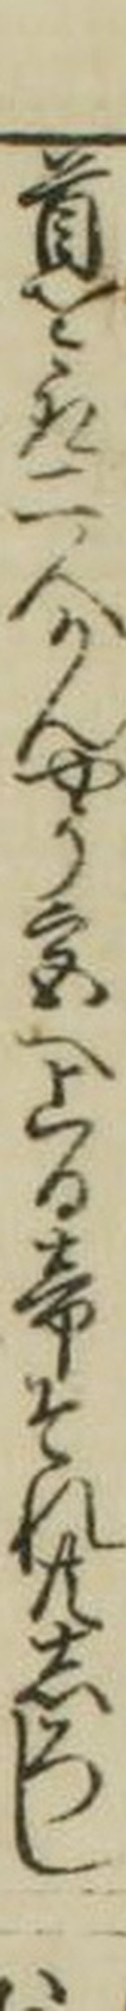首を取二人かんやう宮へ上る帝それ共しろし
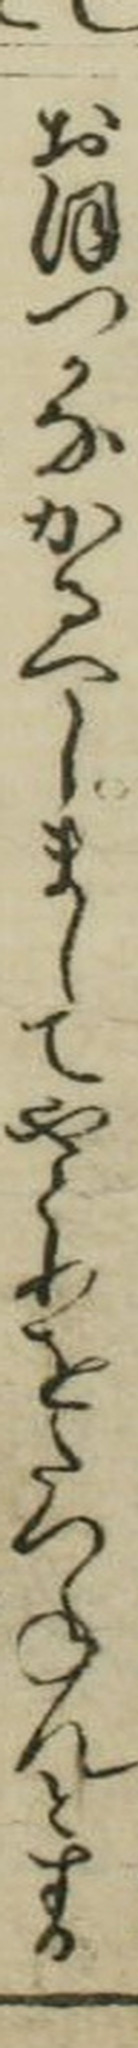おほつかなかるへし。ましてやとりをたつねんとする
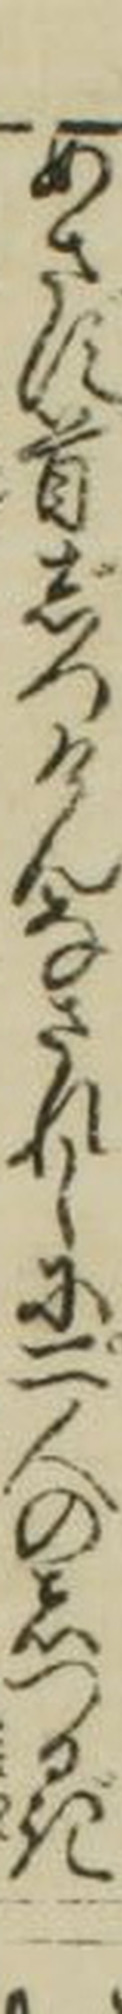めさず首じつけんなされしに。二人の者つるぎ
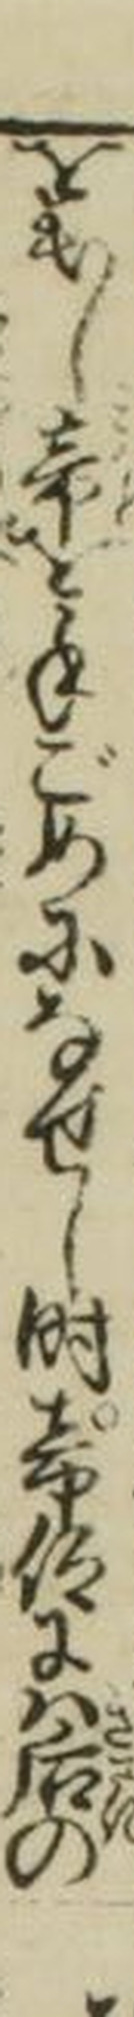を出し帝を手ごめになせし時。帝仰には后の
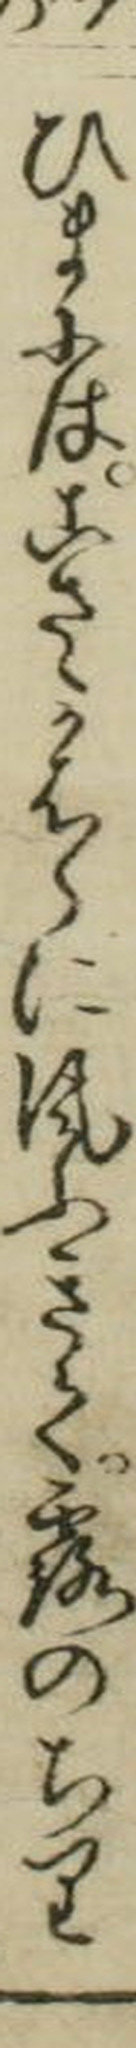ひまには。こさゝかはらに風ふきて。露のちり
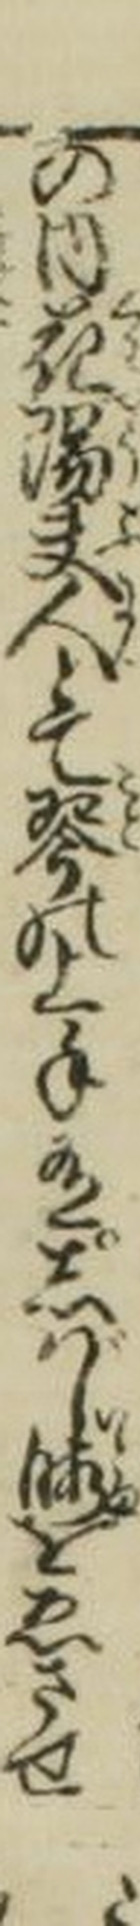の内花陽夫人とて琴の上手有。しばし暇をゑさせ
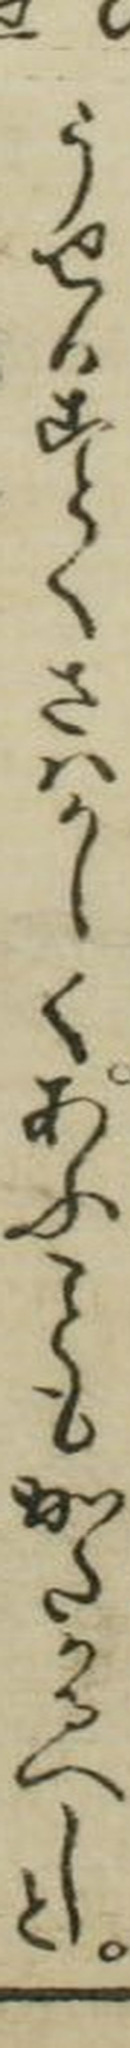うせることくさはかしく。あふこともかたかるへしと。
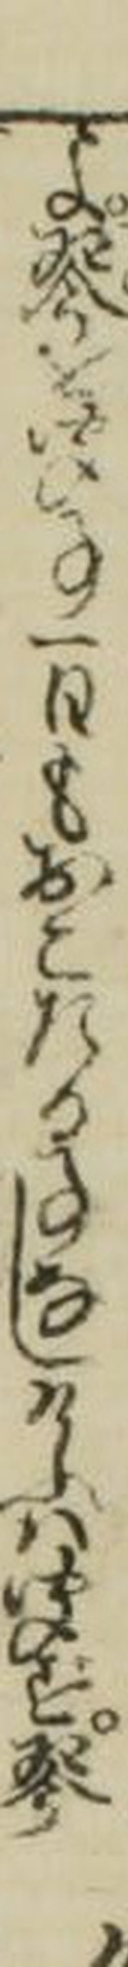よ。琴を聞事一日もおこたる事なしけふは聞ず。琴
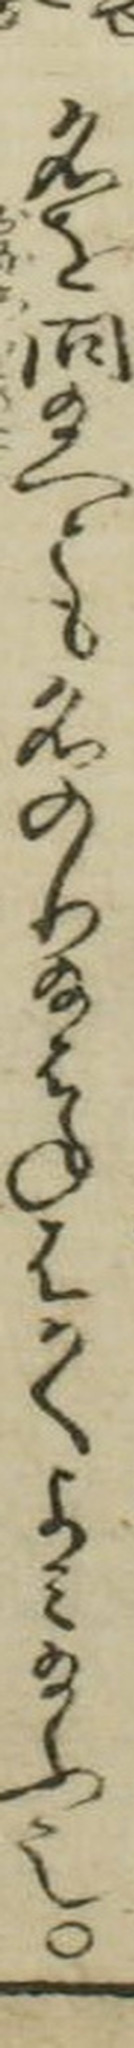名を問給へとも名のり給はねはかくよみ給ふ也。
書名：女源氏教訓鑑
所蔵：東京学芸大学附属図書館
